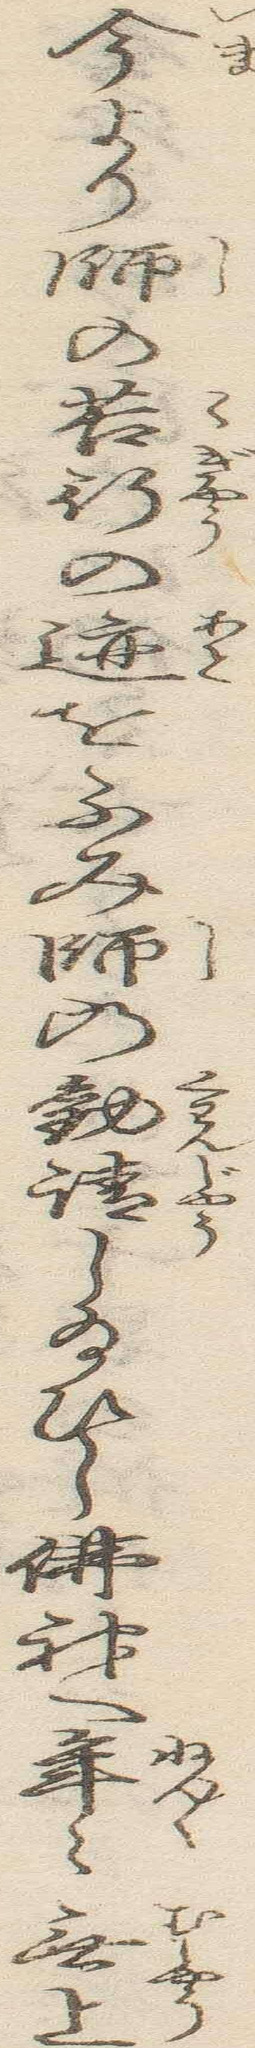今より師の苦行の迹をふみ師の勸請し給ひし佛神へ年〻無上
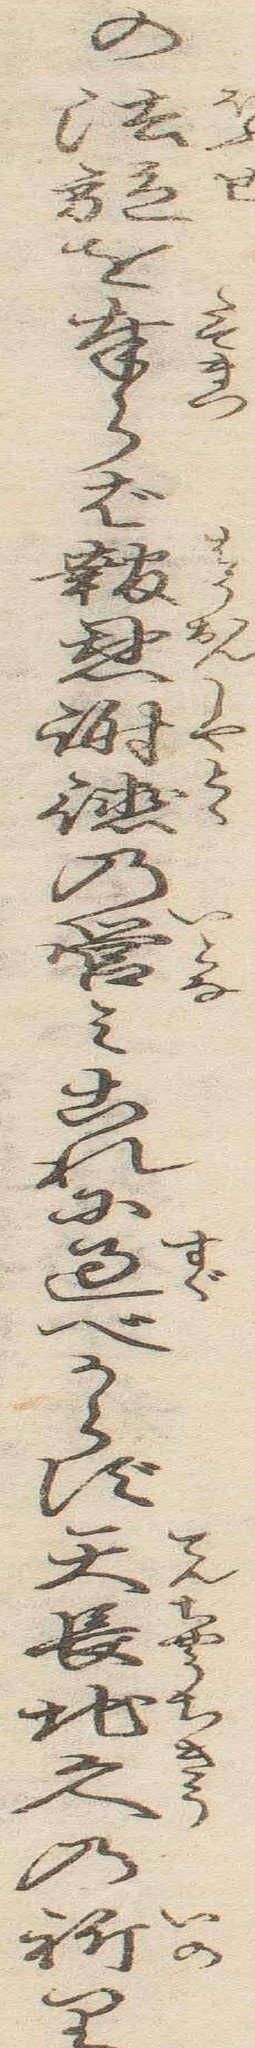の法施を奉らば報恩謝德の営みこれに過べからず天長地久の祈り
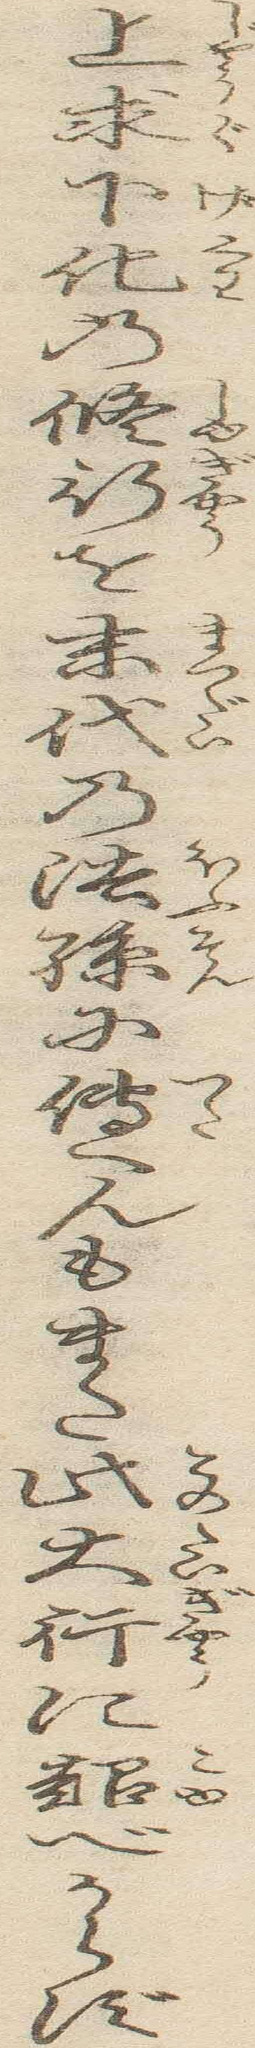上求下化の修行を末代の法孫に傳へんもまた此大行に報べからず
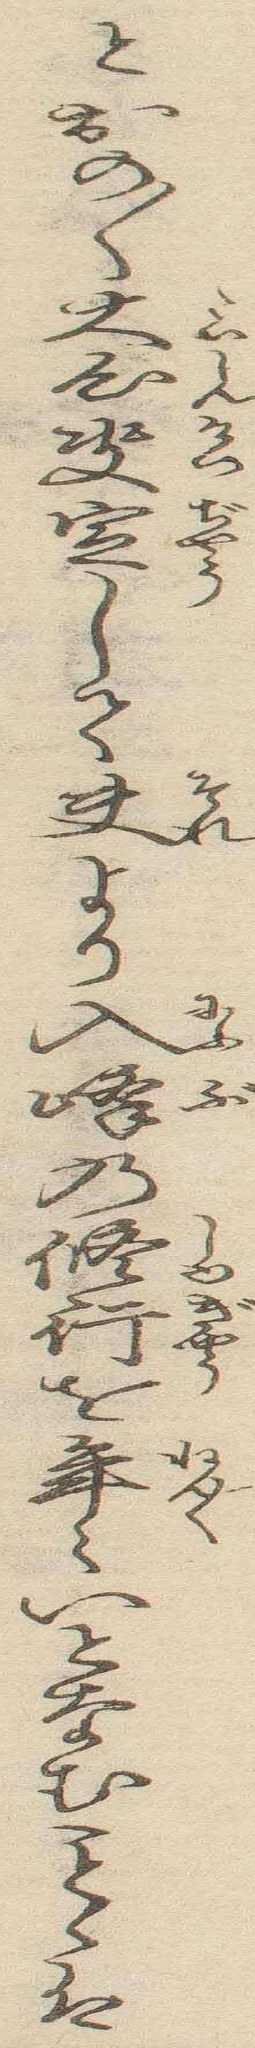とおの〳〵大心決定して夫より入峰の修行を年〻いとなむことゝは

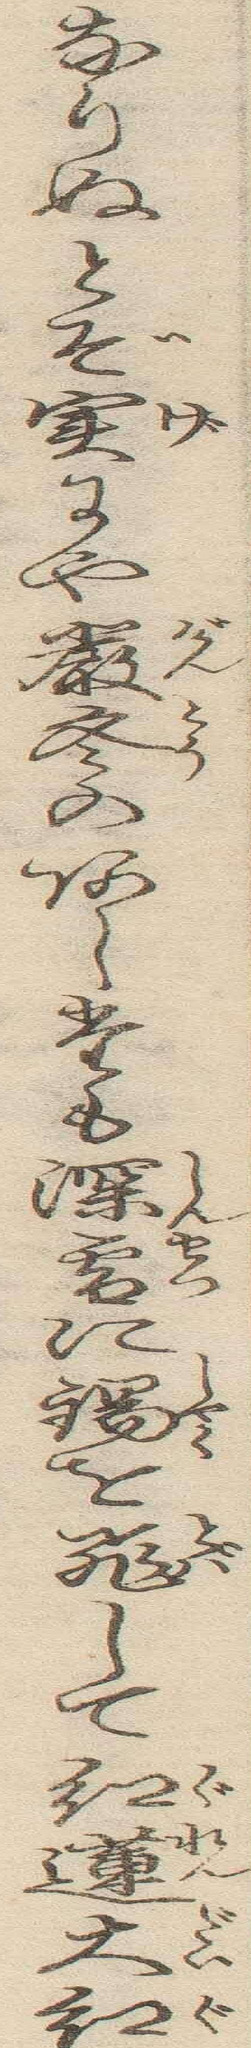なりぬとぞ実にや嚴冬のあしたも深雪に錫を飛して紅蓮大紅
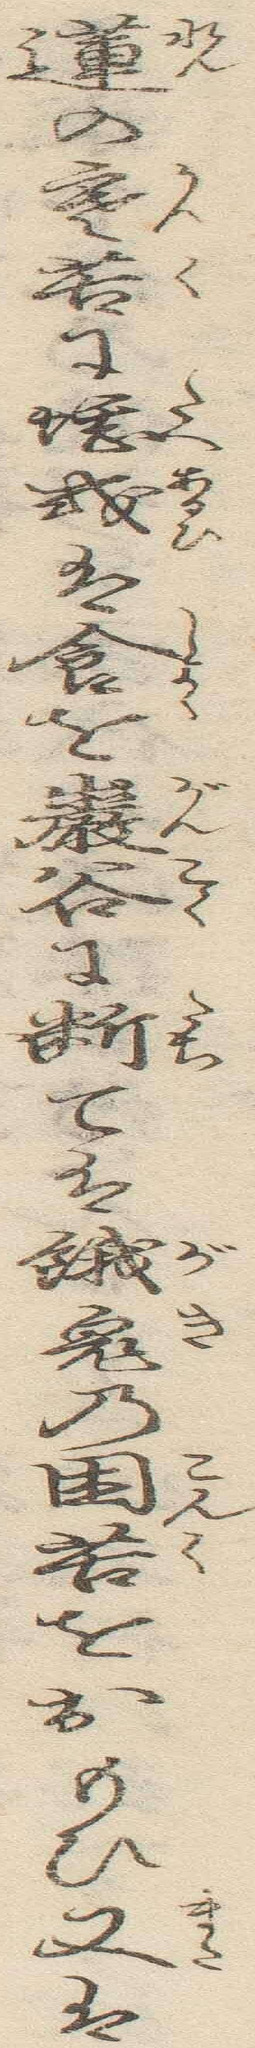蓮の寒苦に堪或は食を巖谷に断ては餓鬼の困苦をおもひ又は
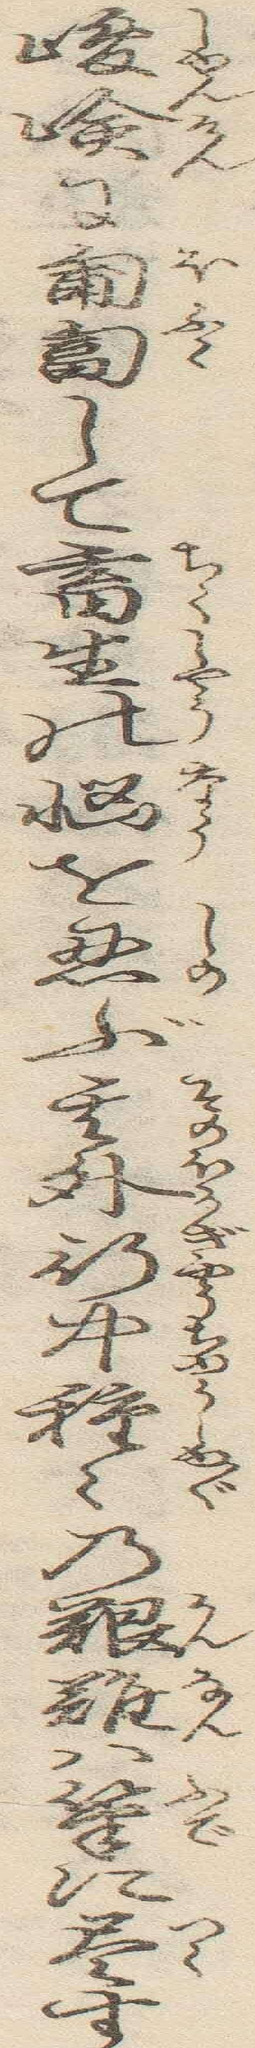峻𡸴に匍匐して畜生の悩を忍ぶ其外行中種〻の艱難は筆に尽す
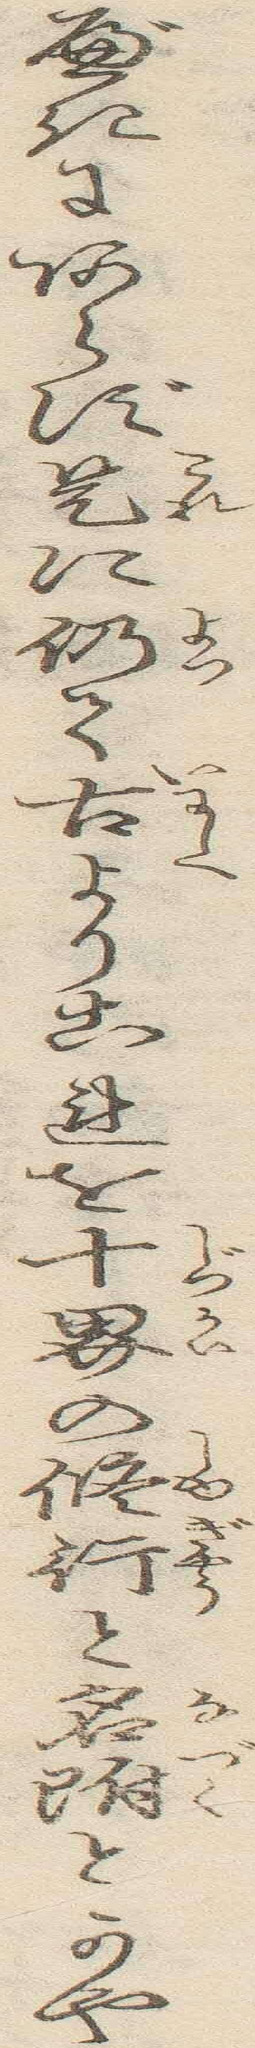べきにあらず是に仍て古よりこれを十界の修行と名附とかや
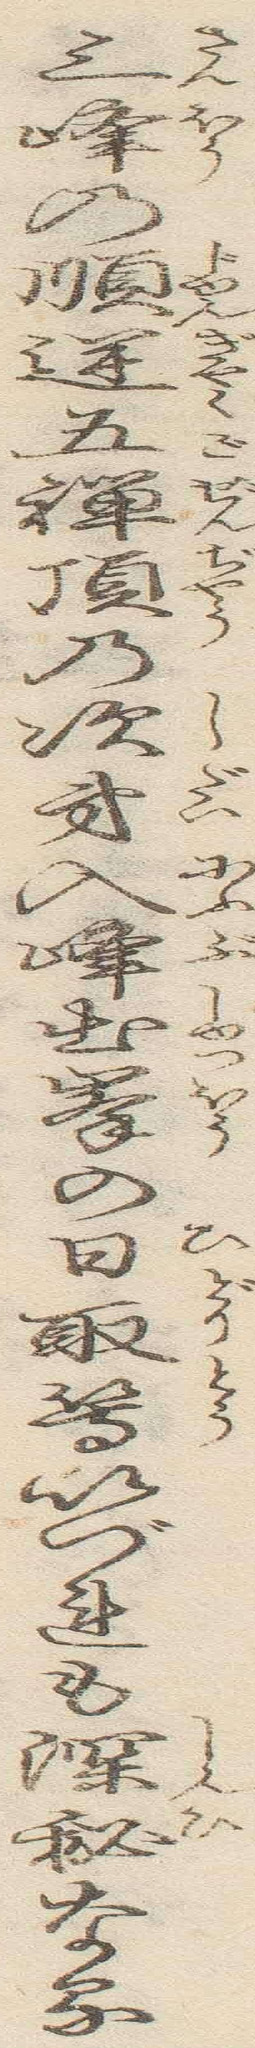三峰の順逆五禅頂の次㐧入峰出峯の日取等いづれも深秘なる
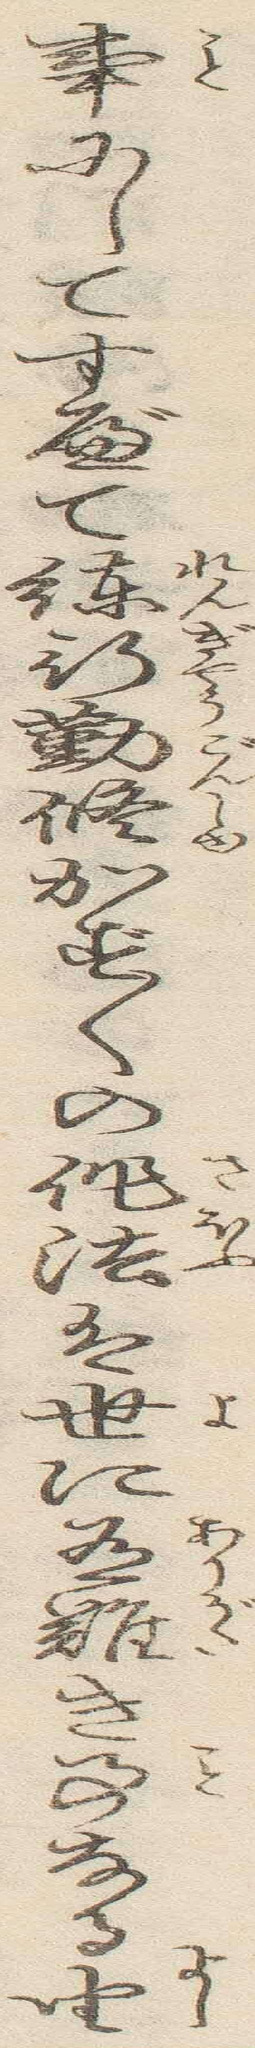事にしてすべて練行勤修かず〳〵の作法は世に有難き事なる由
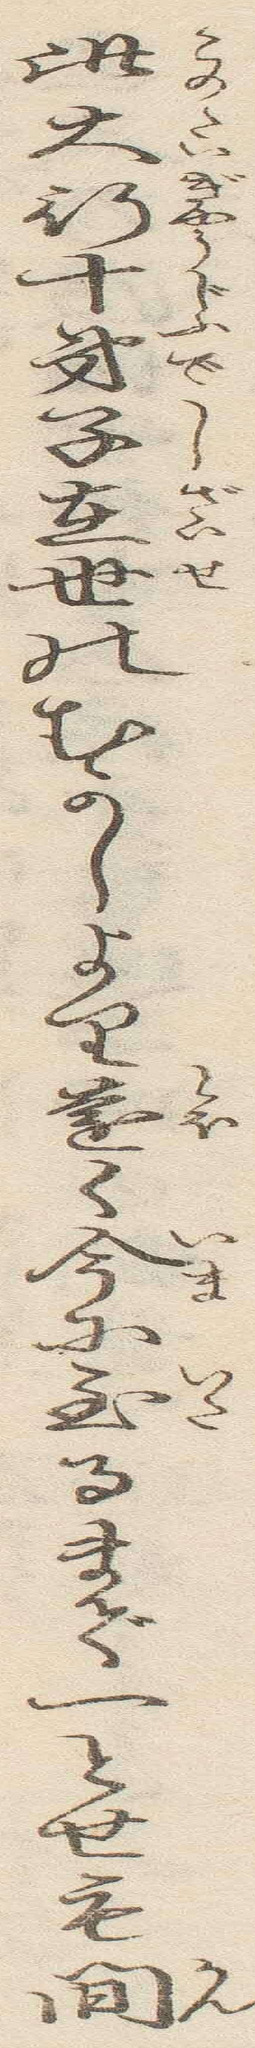此大行十㐧子在世のむかしより遠く今に至るまで一とせも間
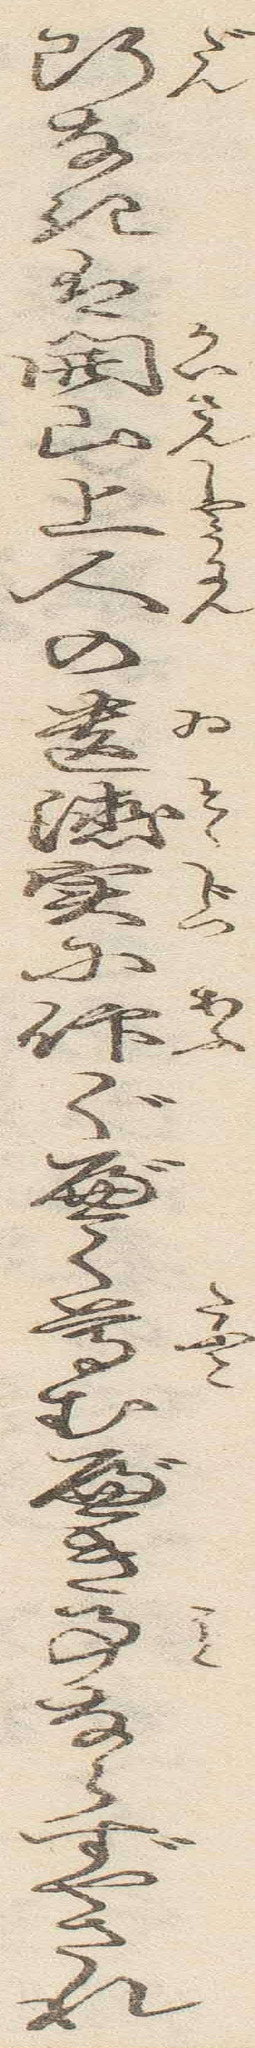断なきは開山上人の遺徳実に仰ぐべく尊むべき事ならずやされ
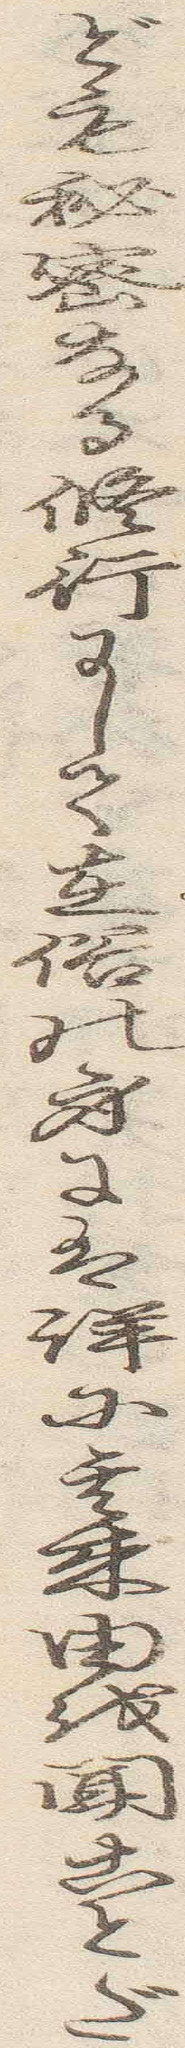ども秘密なる修行にして在俗の身には詳に其来由を聞ことだ
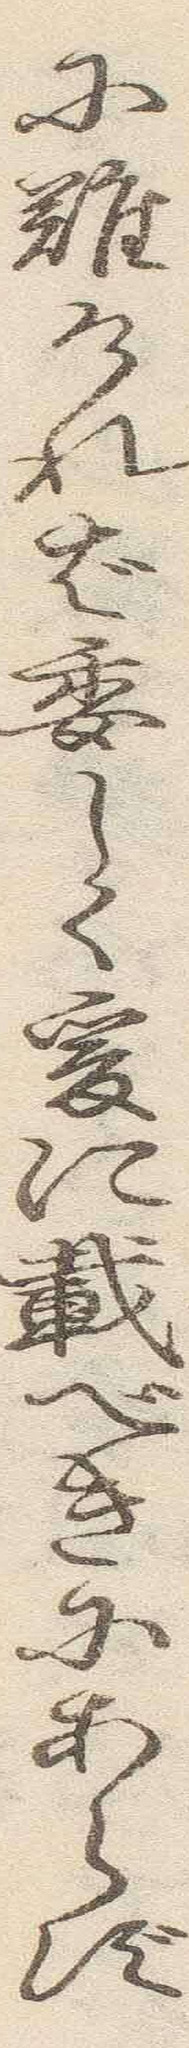に難ければ委しく爰に載べきにあらず
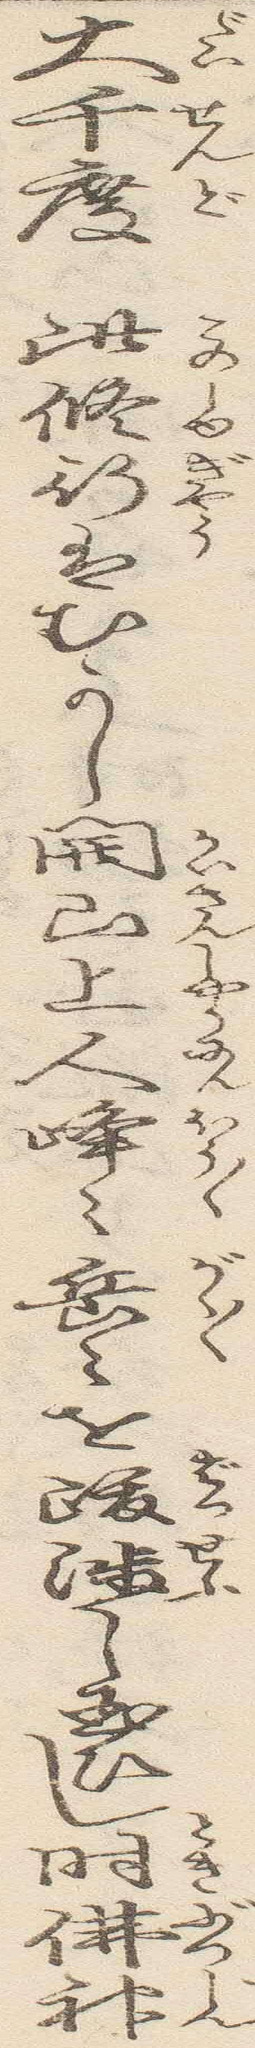大千度此修行はむかし開山上人峰〻岳〻を跋渉し玉ひし时佛神
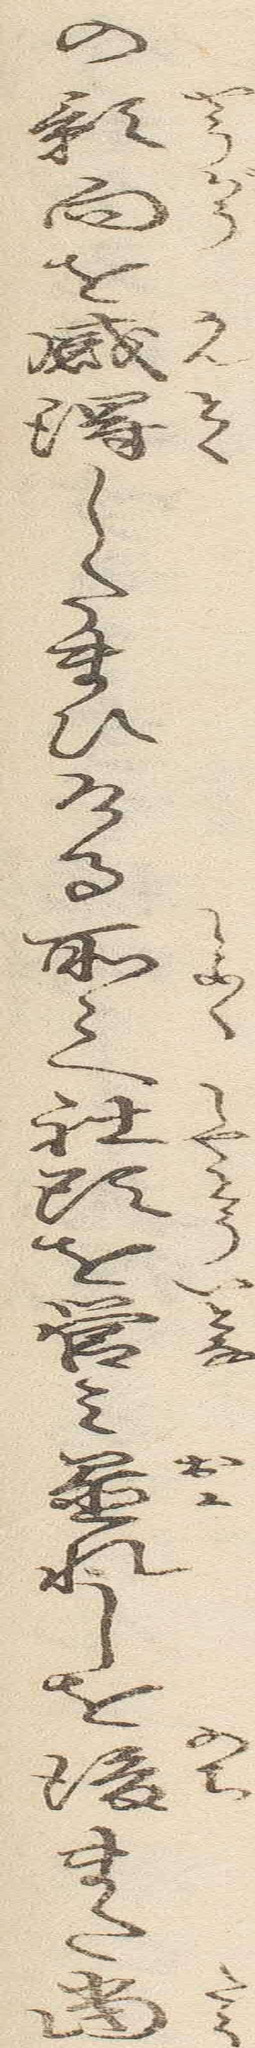の影向を感得したまひける所〻へ社頭を営み置れしを後また當
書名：日光山志
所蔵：東京学芸大学附属図書館 国文学研究資料館
